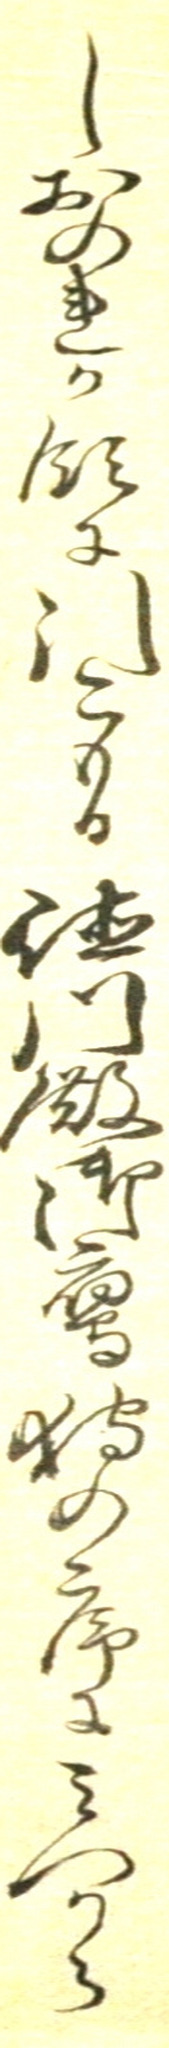しおのれか領に引こもる徳川殿御鷹狩の序にみつから
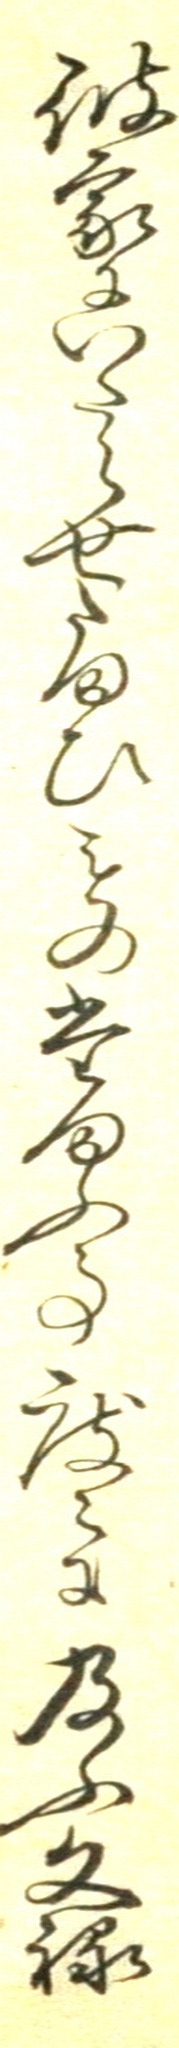彼家にいたらせたまひものたまふ事度々に及ふ文禄
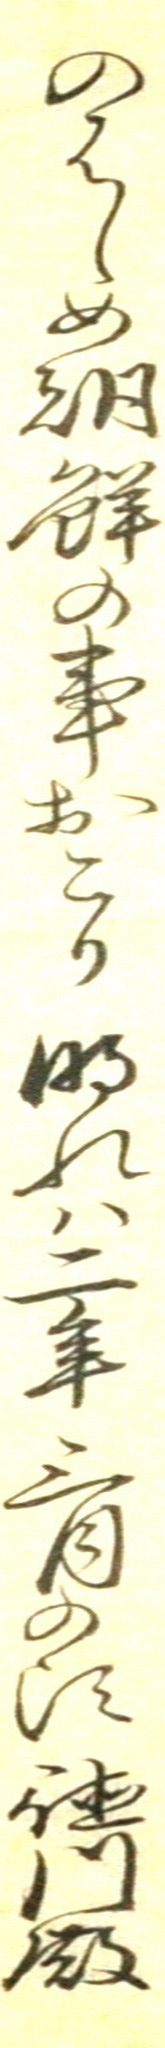のはしめ朝鮮の事おこり明れは二年三月の頃徳川殿
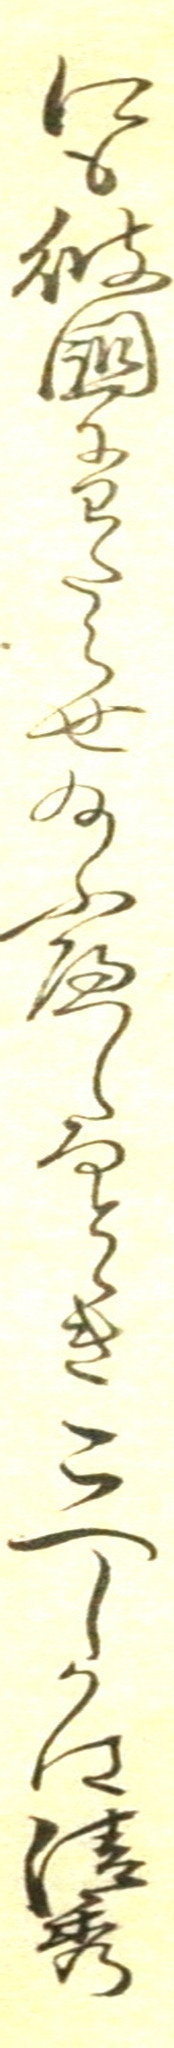にも彼国にわたらせ給ふへしなとゝきこへしかは清秀
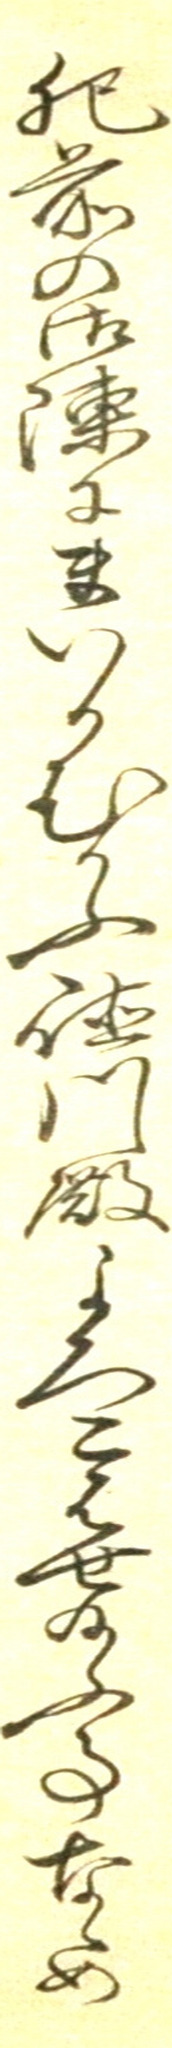肥前の御陣にまいりむかふ徳川殿よろこはせ給ふ事なゝめ
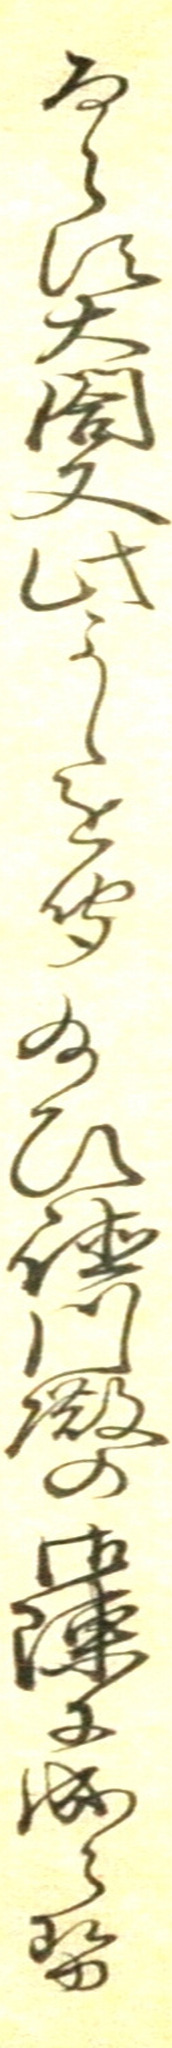ならす太閤又此よしを聞給ひ徳川殿の御陣に成らせ
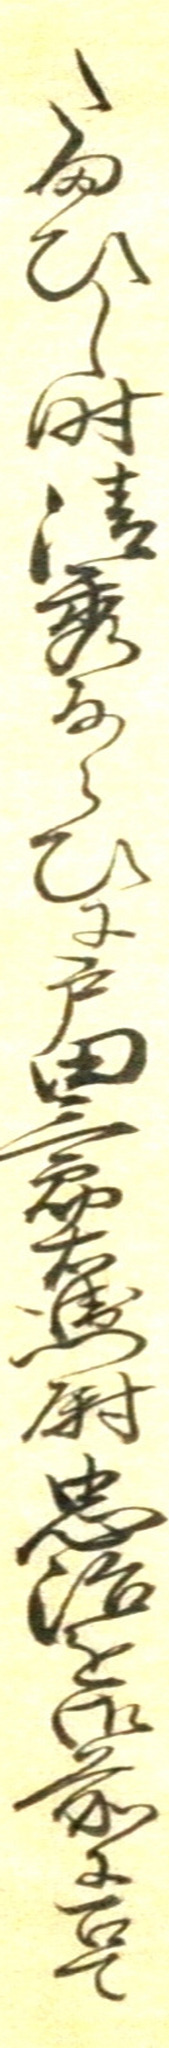たまひし時清秀ならひに戸田三郎右衛門尉忠治を御前に召て
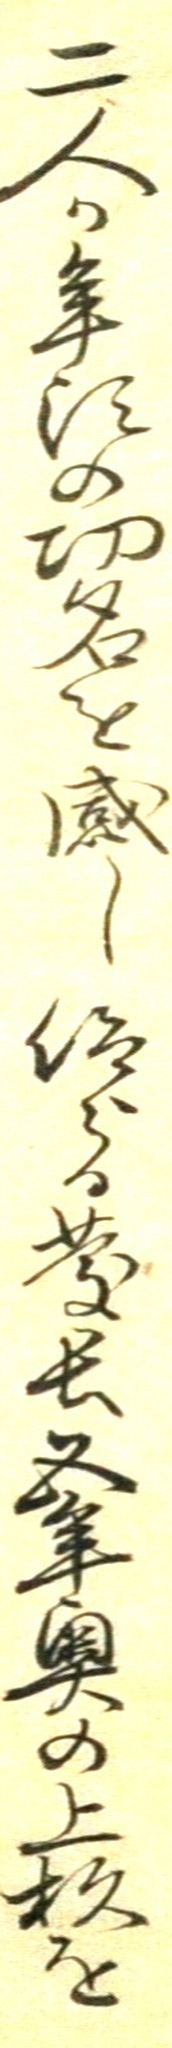二人か年頃の功名を感し仰らる慶長五年奥の上杉を
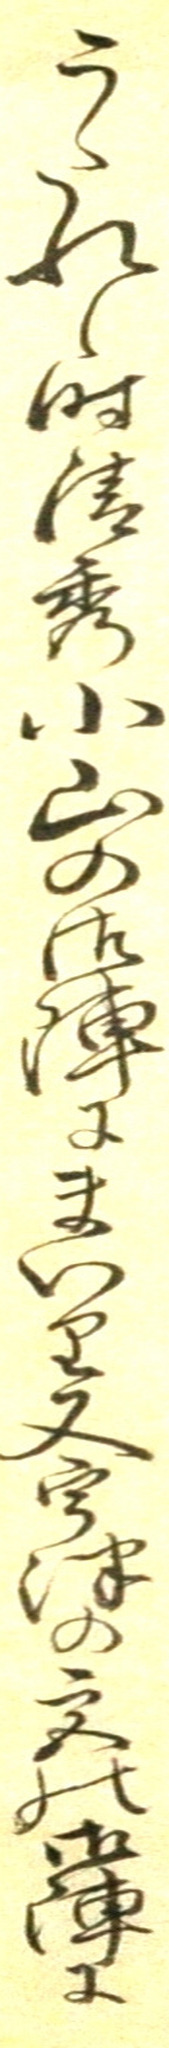うたれし時清秀小山の御陣にまいり又宇津の宮の御陣に
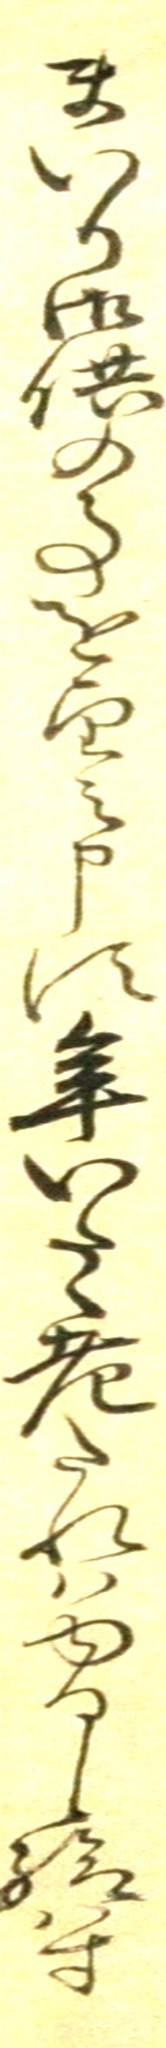まいり御供の事を望み申す年いたく老たれはゆるし給はす
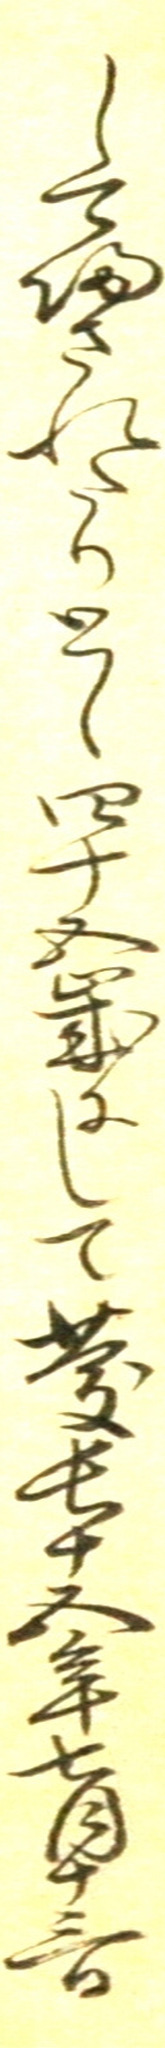して帰されたりとし四十五歳にして慶長十五年七月十三日

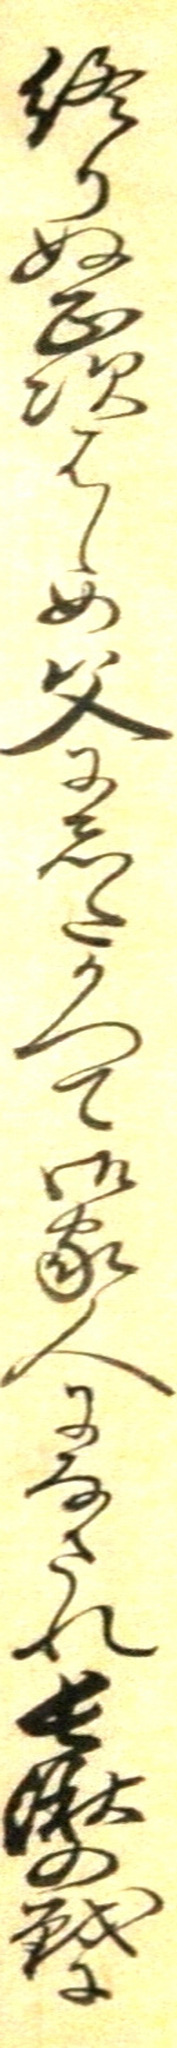終りぬ正次はしめ父にしたかつて御家人になされ長湫の戦に
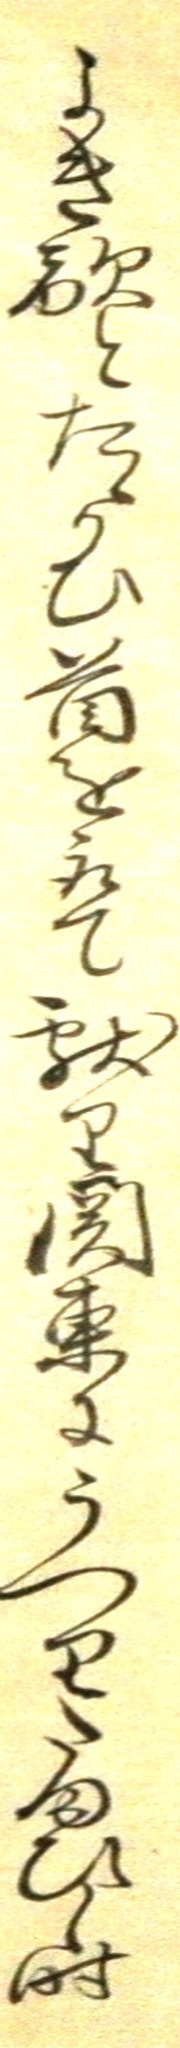よき敵とたゝかひ首を取て献り関東にうつりたまひし時
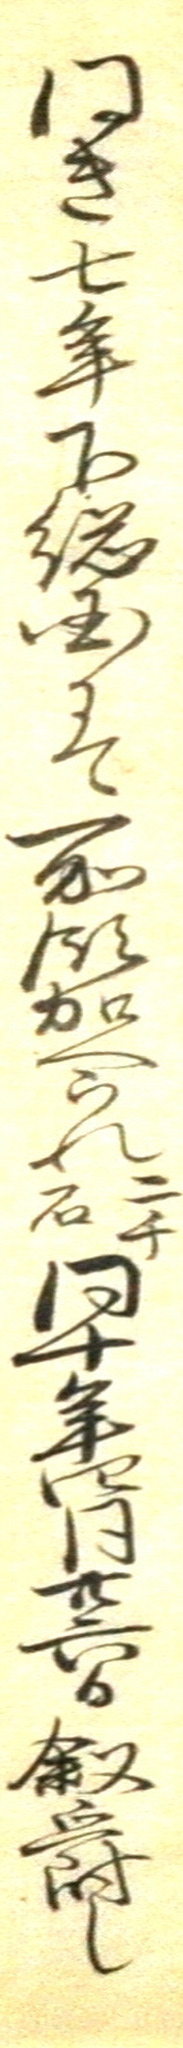同き七年下総国にて所領加へられ二千石同十年四月廿六日叙爵し
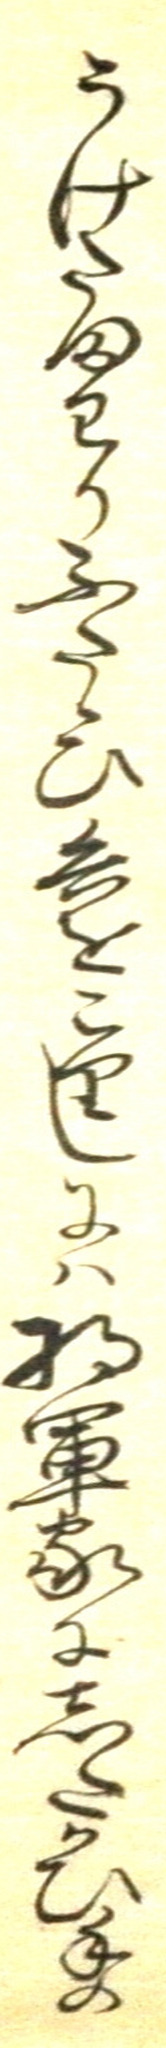うけたまわりふたゝひ兵をこりしには将軍家にしたかひ手の
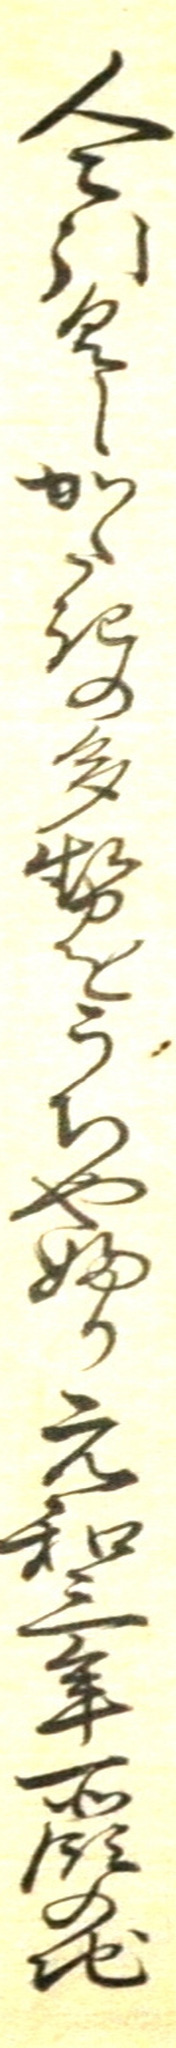人々引具しかたきの多勢をうちやふり元和三年所領の地
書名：藩翰譜（四・下）
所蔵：伊那市立高遠町図書館・合同会社AMANE
